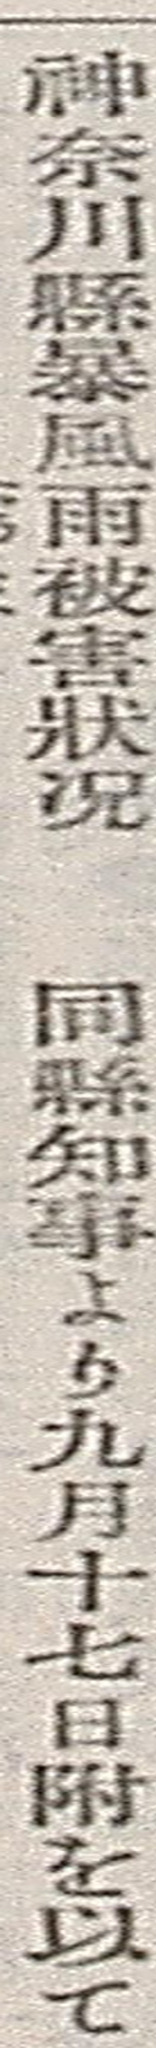神奈川県暴風雨被害状況同県知事より九月十七日附を以て
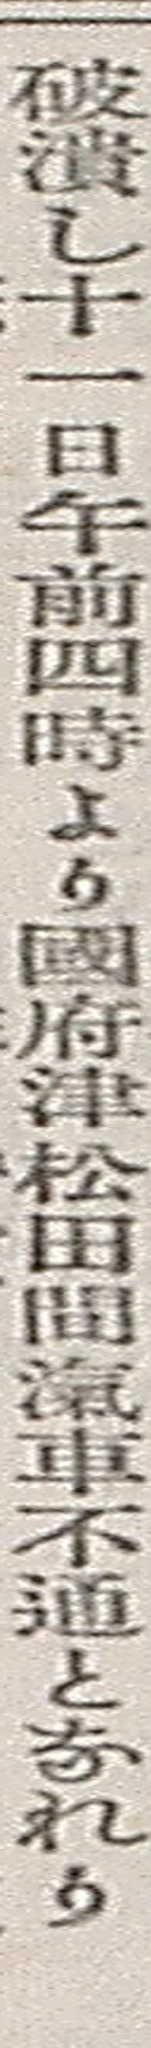破潰し十一日午前四時より国府津松田間汽車不通となれり
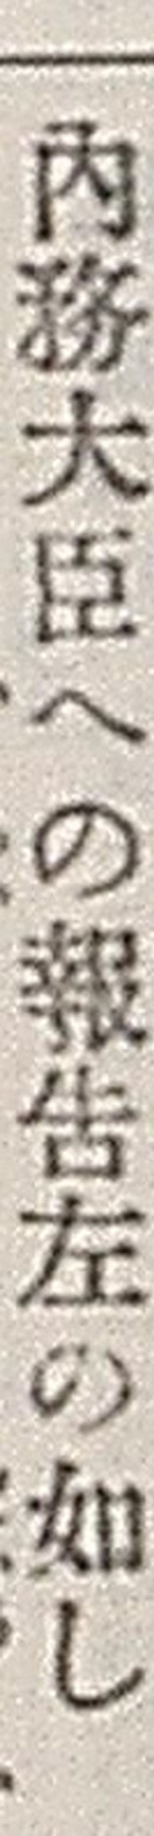内務大臣への報告左の如し
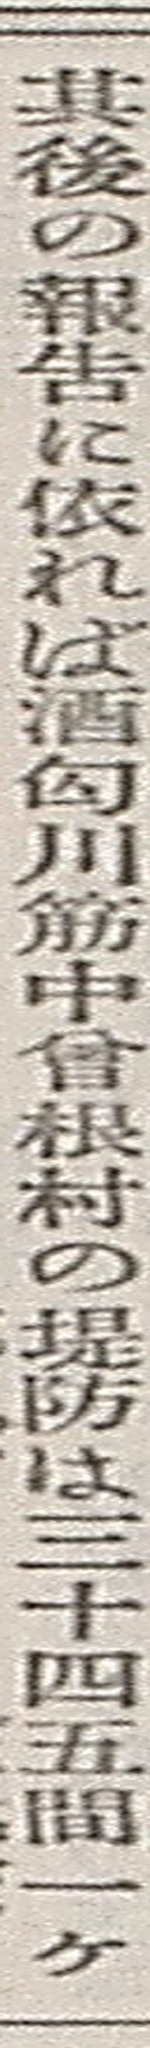其後の報告に依れば酒匂川筋中曽根村の堤防は三十四五間一ヶ
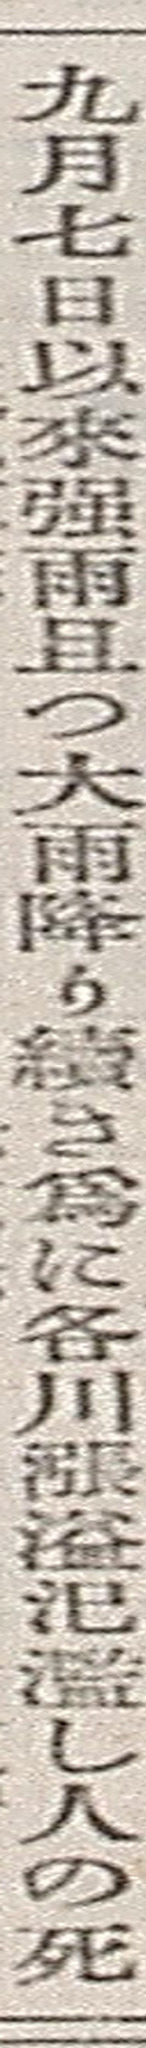九月七日以来強雨且つ大雨降り続き為み各川漲溢氾濫し人の死
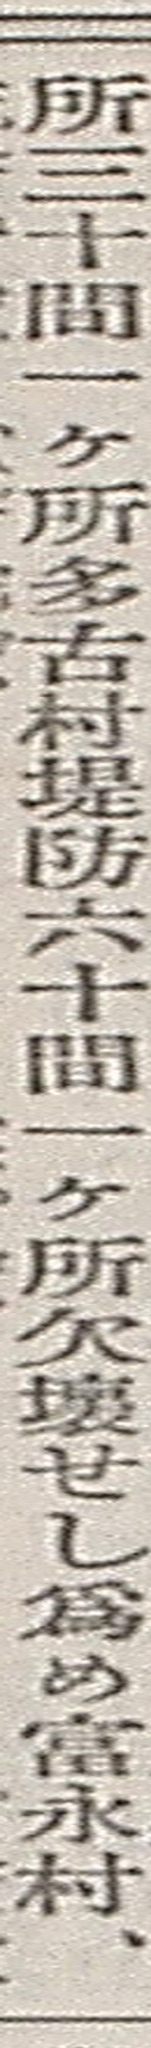所三十間一ヶ所多古村堤防六十間一ヶ所欠壊せし為め富永村、
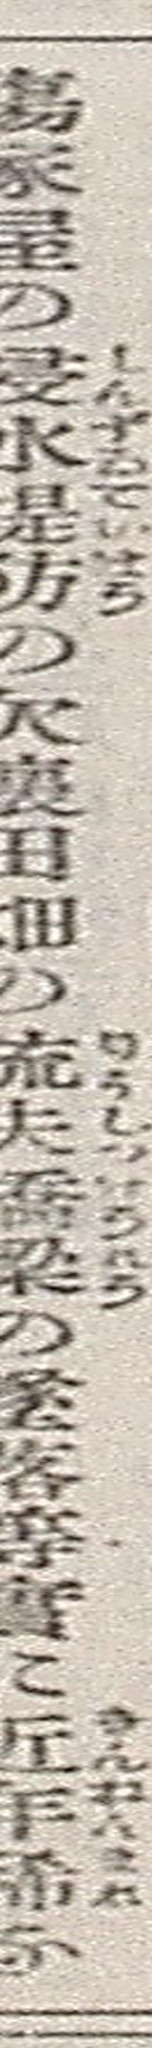傷家屋の浸水堤防の欠壊田畑の流失橋梁の墜落等実に近年希な
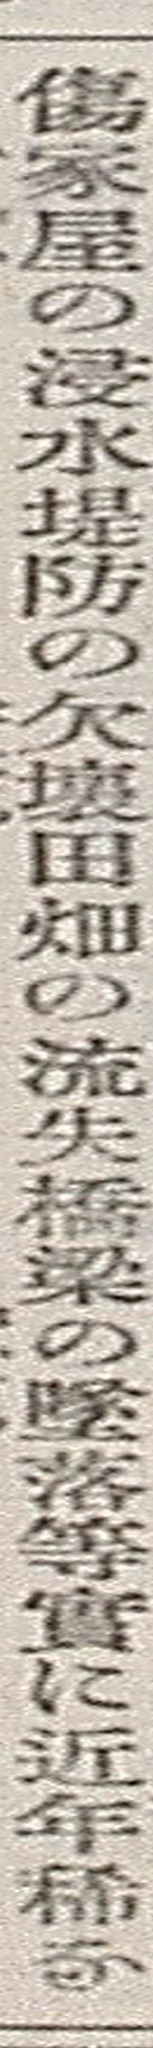傷家屋の浸水堤防の欠壊田畑の流失橋梁の墜落等実に近年希な
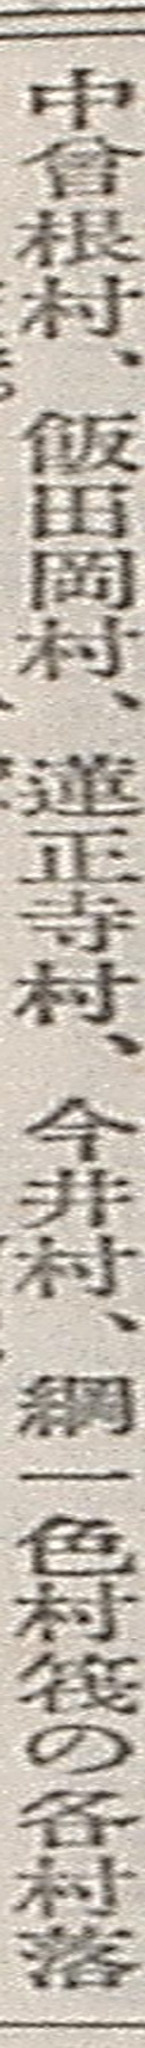中曽根村、飯田岡村、蓮正寺村、今井村、網一色村筏の各村落
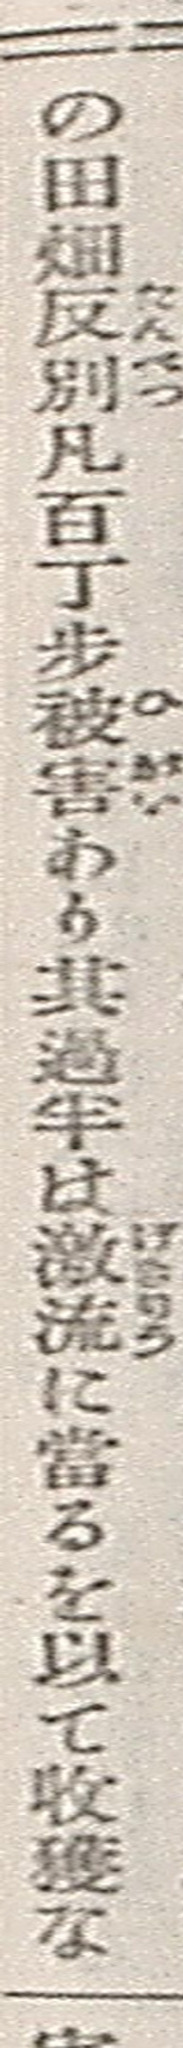の田畑反別凡百丁歩被害あり其過半は激流に当るを以て収穫な
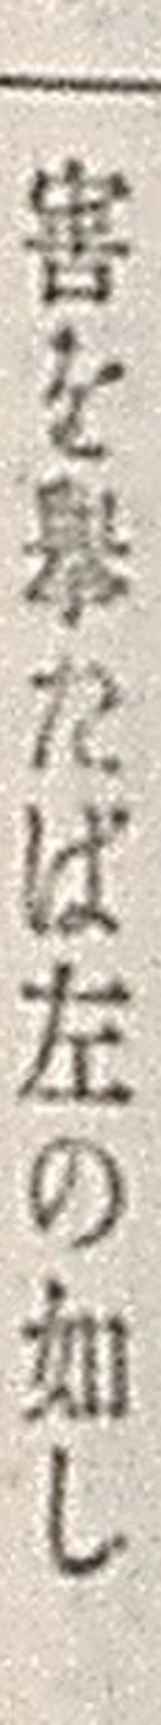害を挙なば左の如し
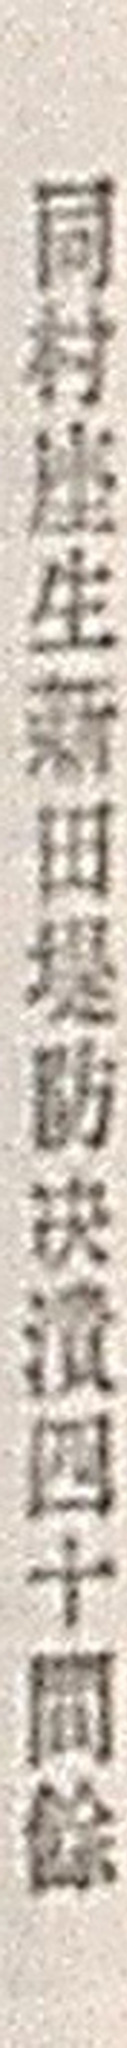同村座生新田堤防决潰四十間餘
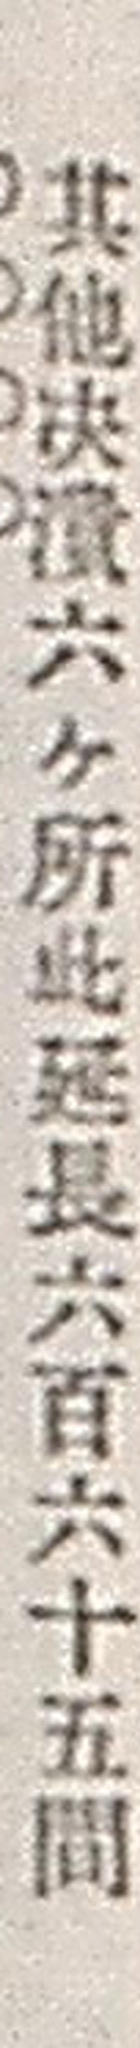其他决潰六ヶ所此延長六百六十五間
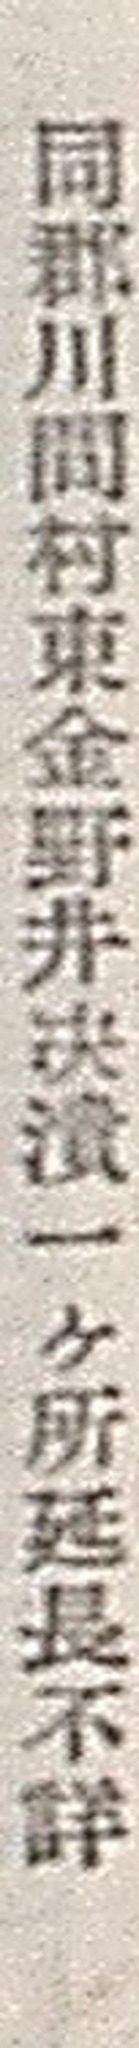同郡川間村東金野井决潰一ヶ所延長不詳
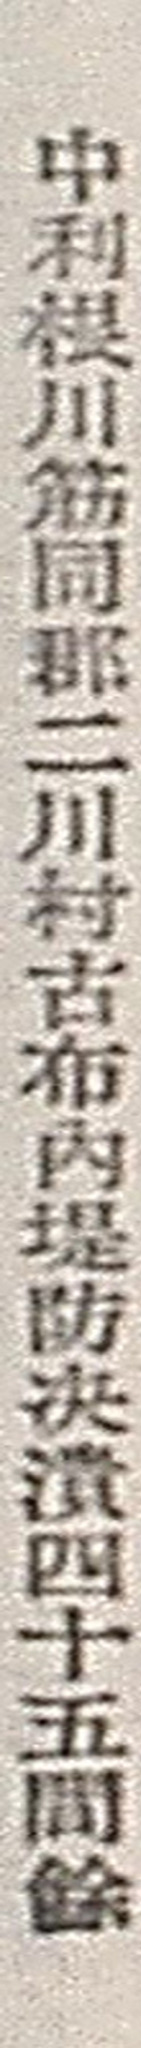中利根川筋同郡二川村古布内堤防决潰四十五間餘
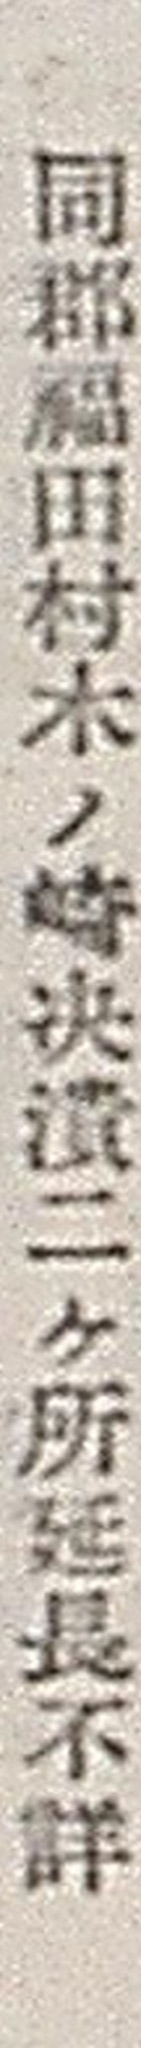同郡福田村木ノ崎决潰二ヶ所延長不詳
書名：風俗畫報臨時増刊第百二十八號　洪水被害録（下）
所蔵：東京大学地震研究所図書室 Earthquake Research Institute Library, The University of Tokyo, JAPAN
